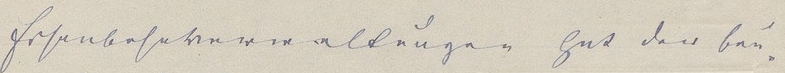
Eisenbahnverwaltungen hat der bau-
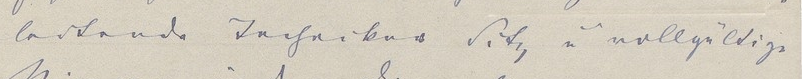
leitende Techniker Sitz u vollgültige
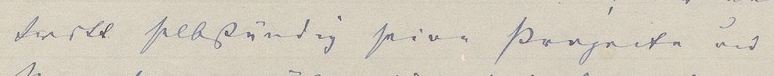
tritt selbständig seine Projekte und
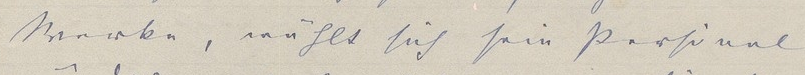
Werke, wählt sich sein Personal
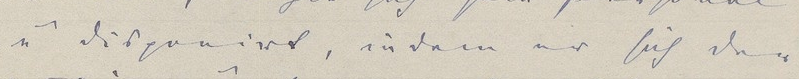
u disponirt, indem er sich der
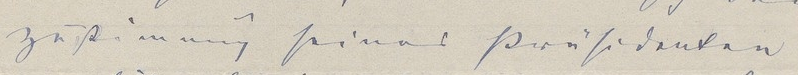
Zustimmung seines Präsidenten
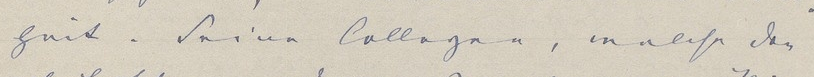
heit. Seine Collegen, welche den
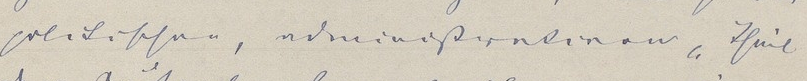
politischen, administrativen Theil
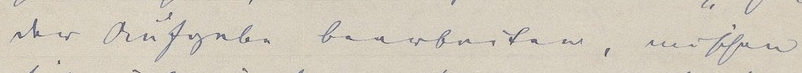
der Aufgabe bearbeiten, mischen
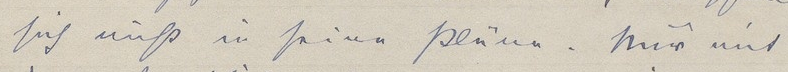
sich nicht in seine Pläne. Nur mit
